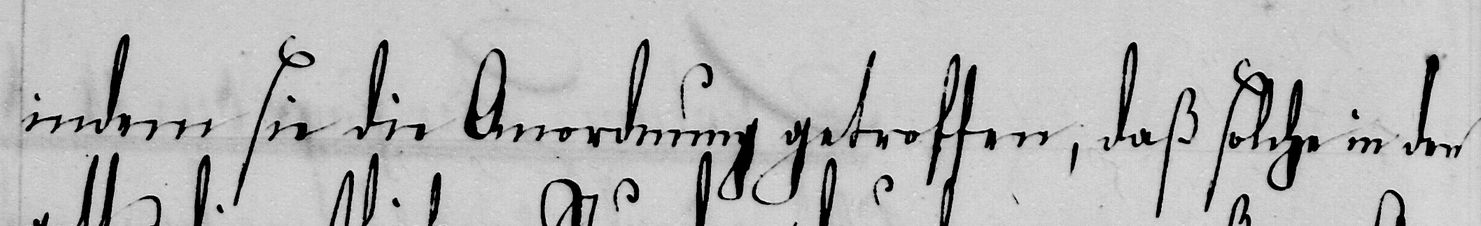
indem sie die Anordnung getroffen, daß solche in
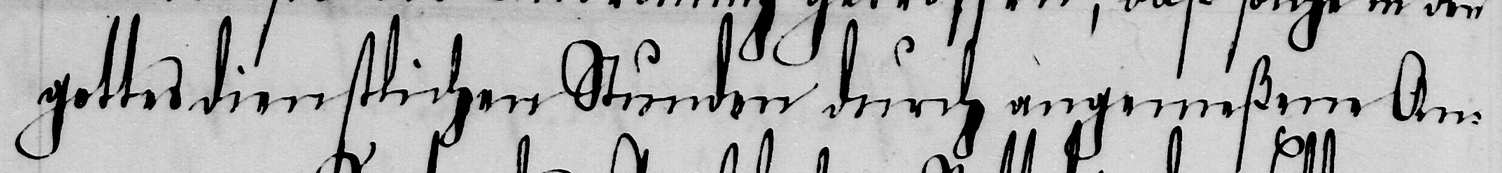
gottesdienstlichen Stunden durch angemeßene An¬
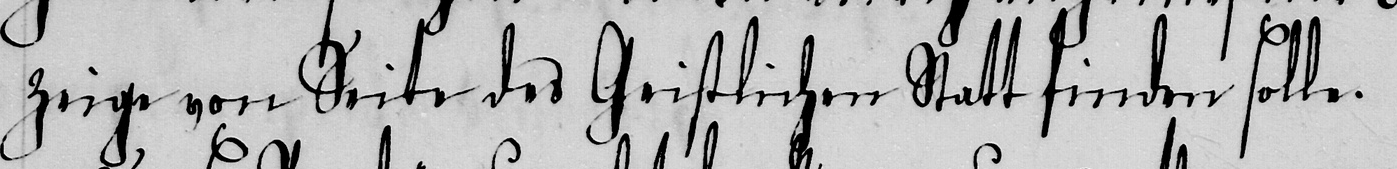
zeige von Seite des Geistlichen Statt finden solle.
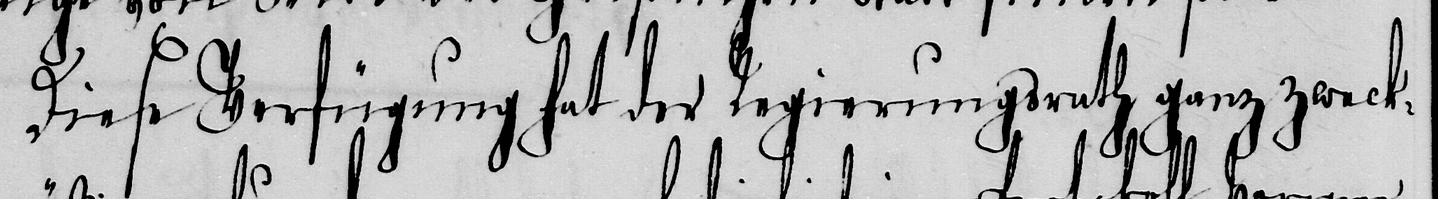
Diese Verfügung hat der Regierungsrath ganz zweck¬
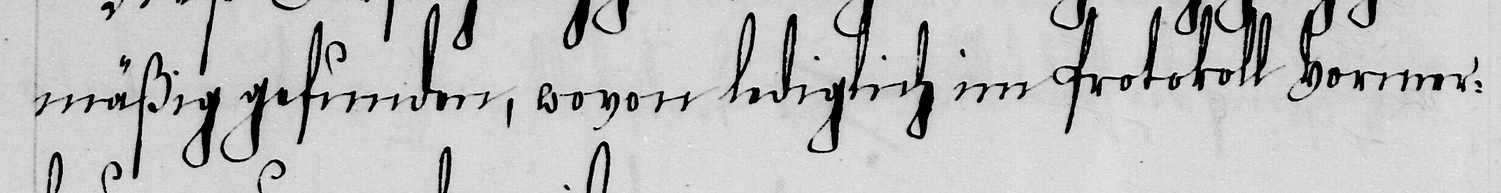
mäßig gefunden, wovon lediglich im Protokoll Vormer¬
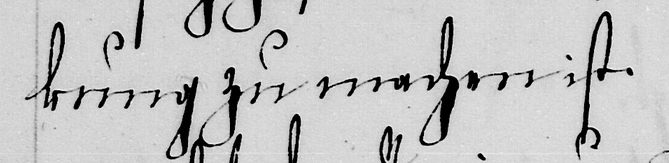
kung zu machen ist.
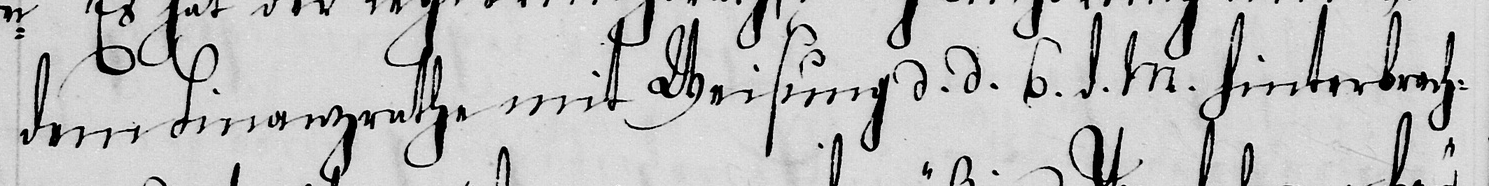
dem Finanzrathe mit Weisung d. d. 6. d. M. hinterbrach¬
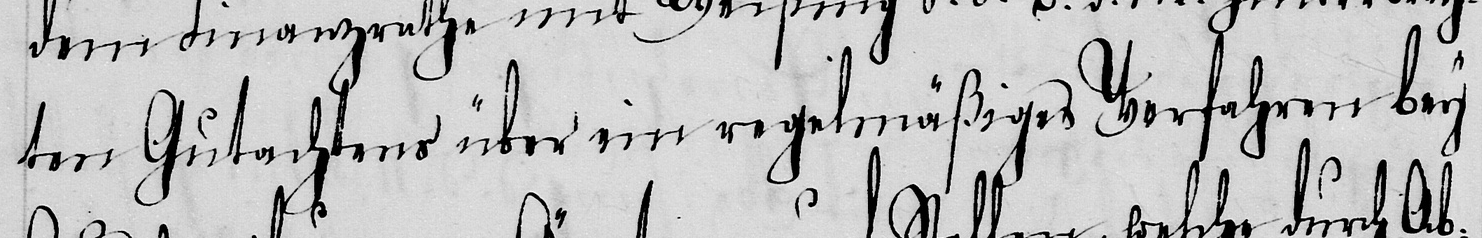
ten Gutachtens über ein regelmäßiges Verfahren bey
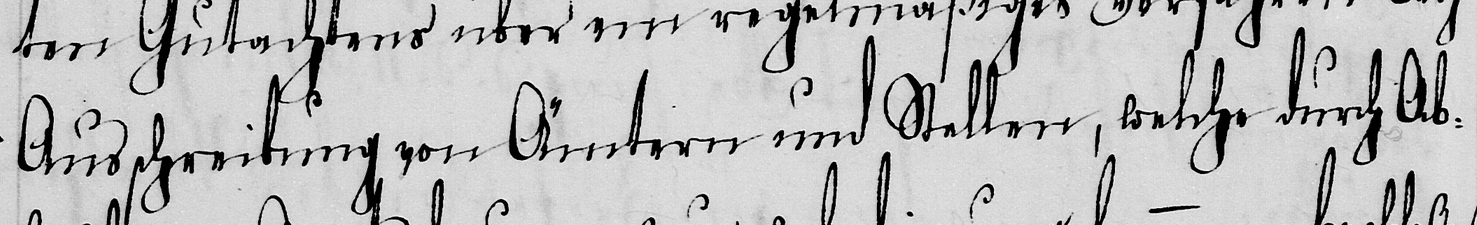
Ausschreibung von Ämtern und Stellen, welche durch Ab¬
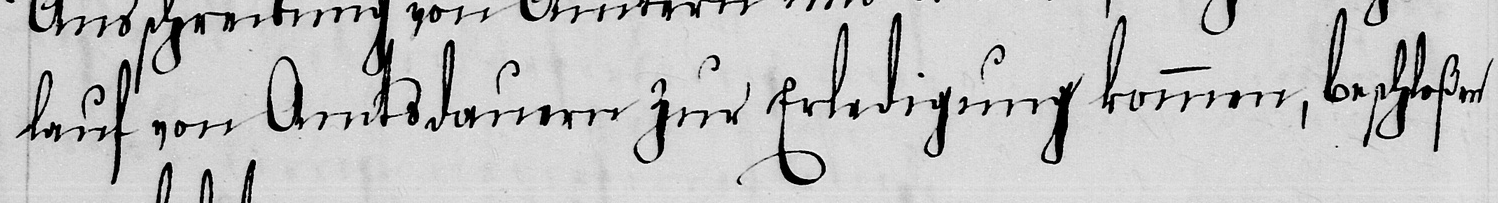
lauf von Amtsdauern zur Erledigung kommen, beschloßen
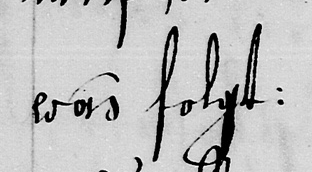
was folgt:
